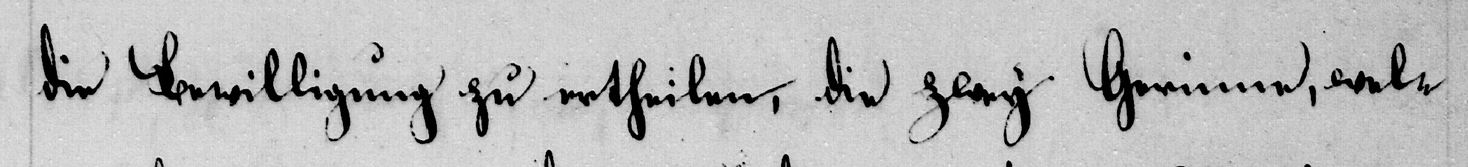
die Bewilligung zu ertheilen, die zwey Gerinne, wel¬
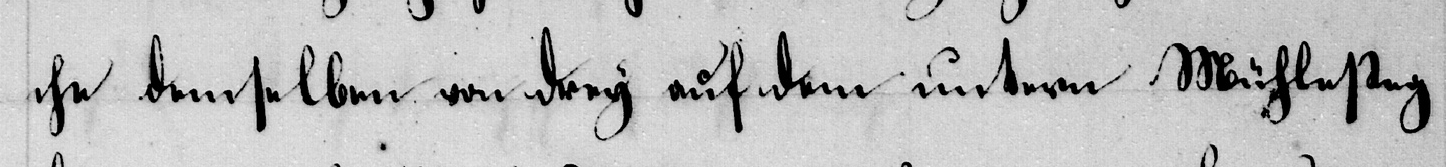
che demselben von drey auf dem untern Mühlesteg
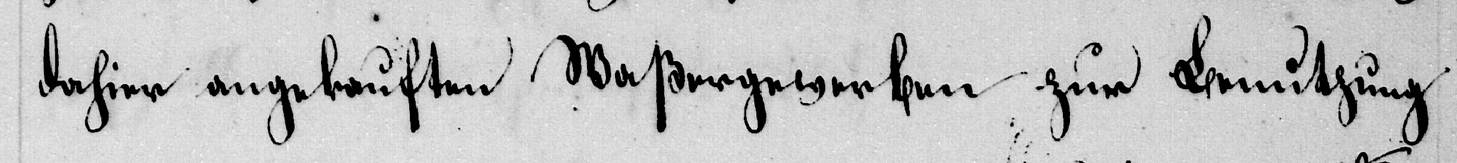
dahier angekauften Waßergewerben zur Benutzung
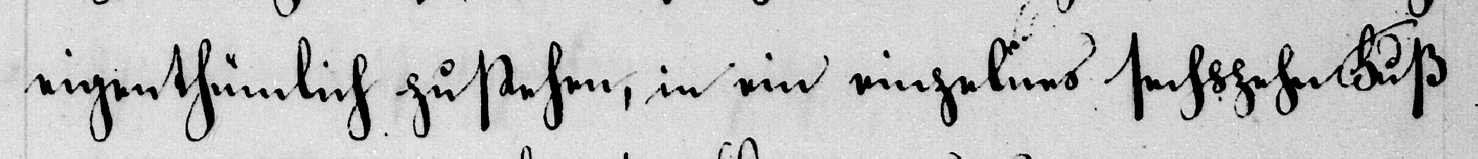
eigenthümlich zustehen, in ein einzelnes sechszehn Fuß
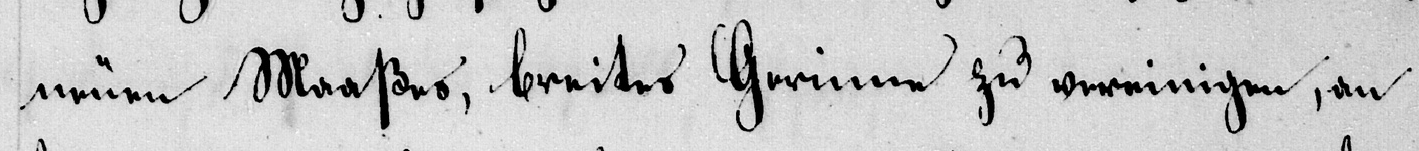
neuen Maaßes, breites Gerinne zu vereinigen, an
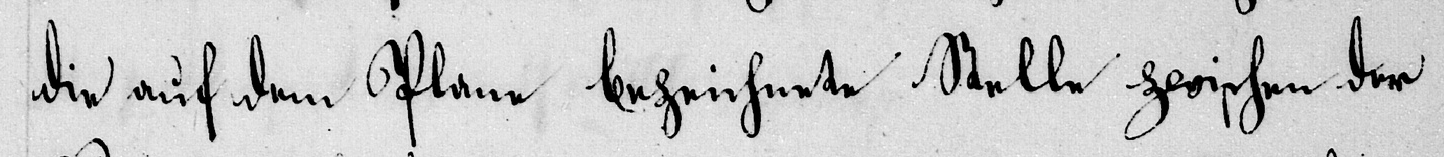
die auf dem Plan bezeichnete Stelle zwischen der
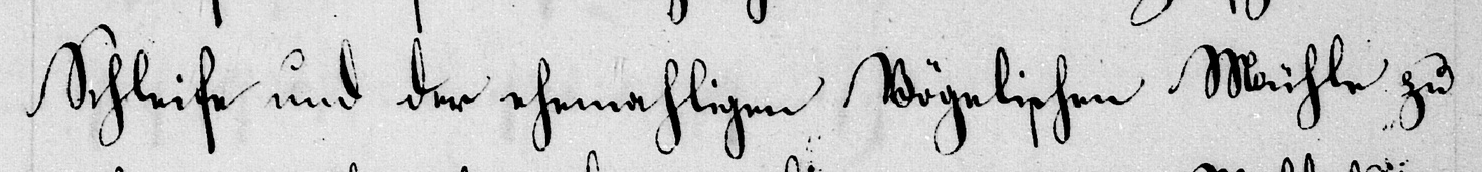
Schleife und der ehemaligen Vögelischen Mühle zu
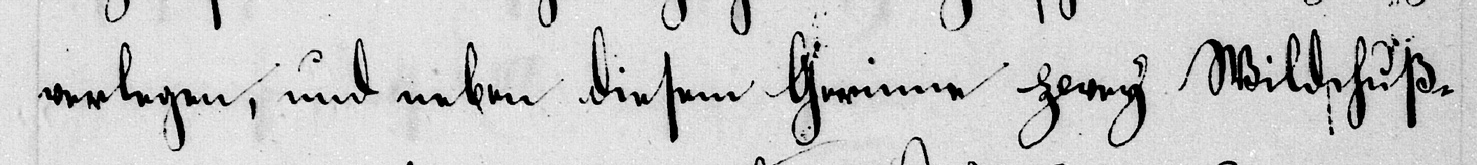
verlegen, und neben diesem Gerinne zwey Wildschuß¬
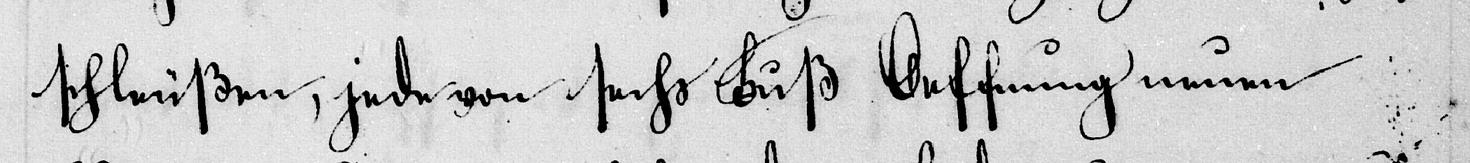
schleußen, jede von sechs Fuß Oeffnung neuen
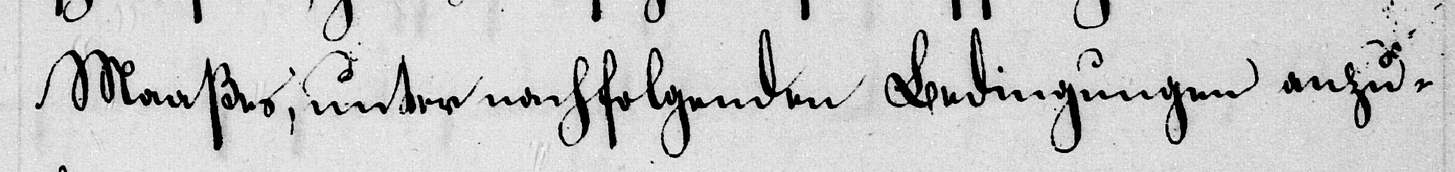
Maaßes, unter nachfolgenden Bedingungen anzu¬
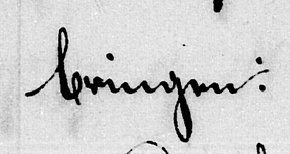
bringen:
